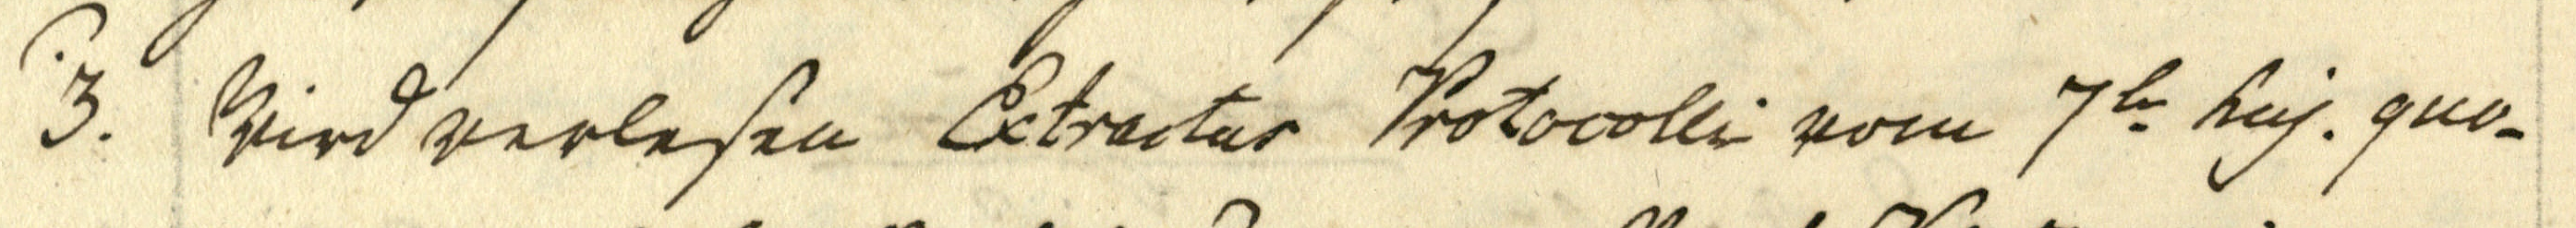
3. Wird verlesen Extractus Protocolli vom 7. huj. quo¬
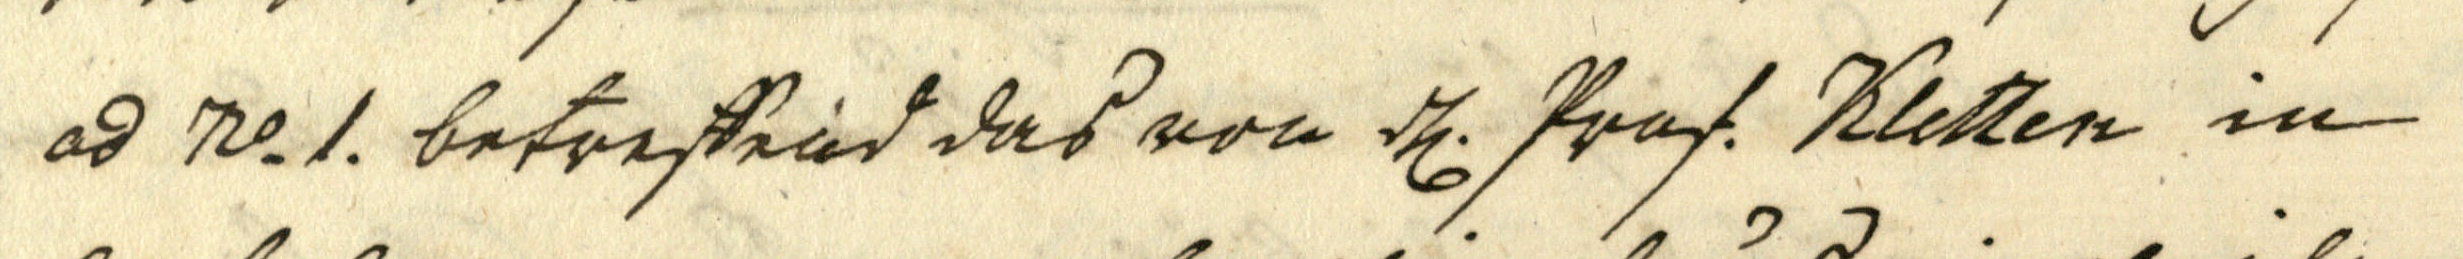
ad No. 1. betreffend das von dh. Prof. Kletten in
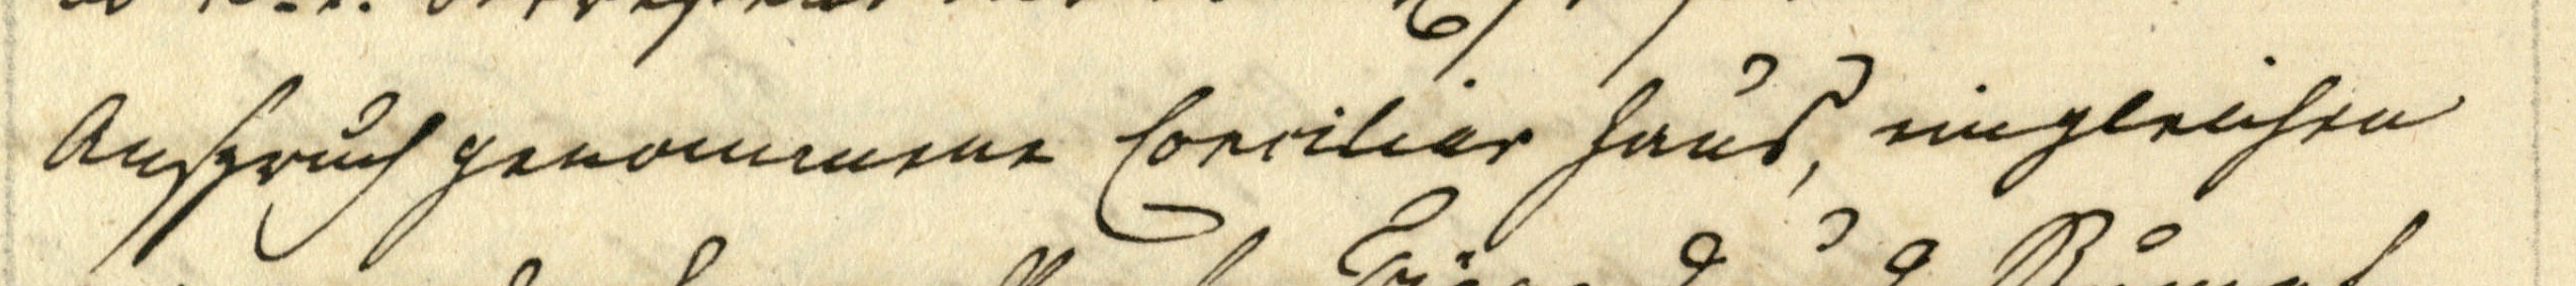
Anspruch genommene Conciliar Haus, imgleichen
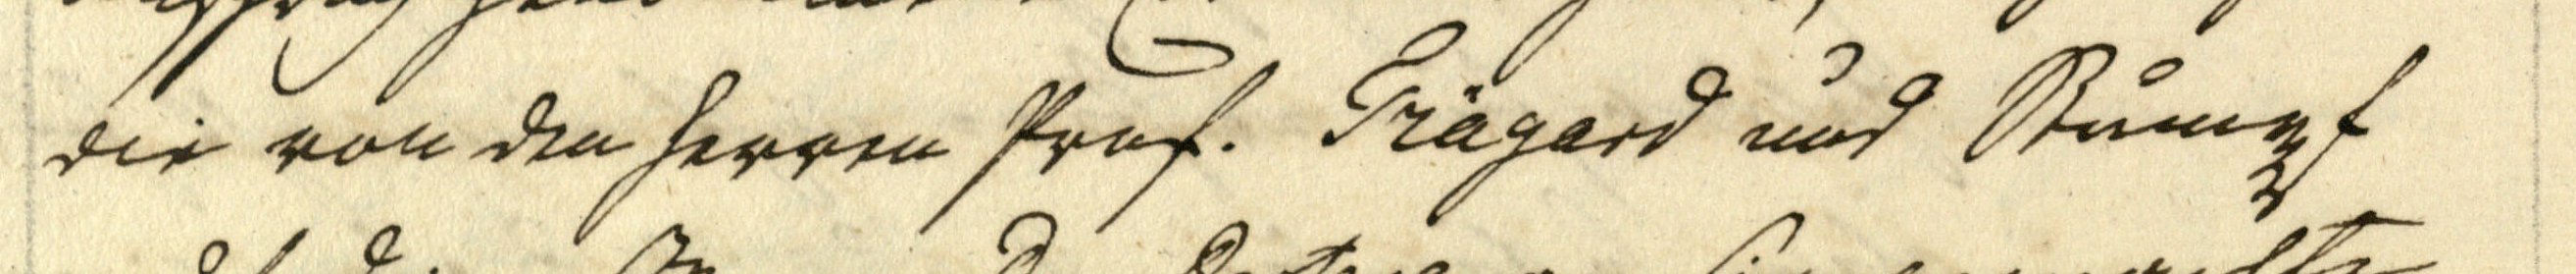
die von den Herren Prof. Trägård und Stumpf
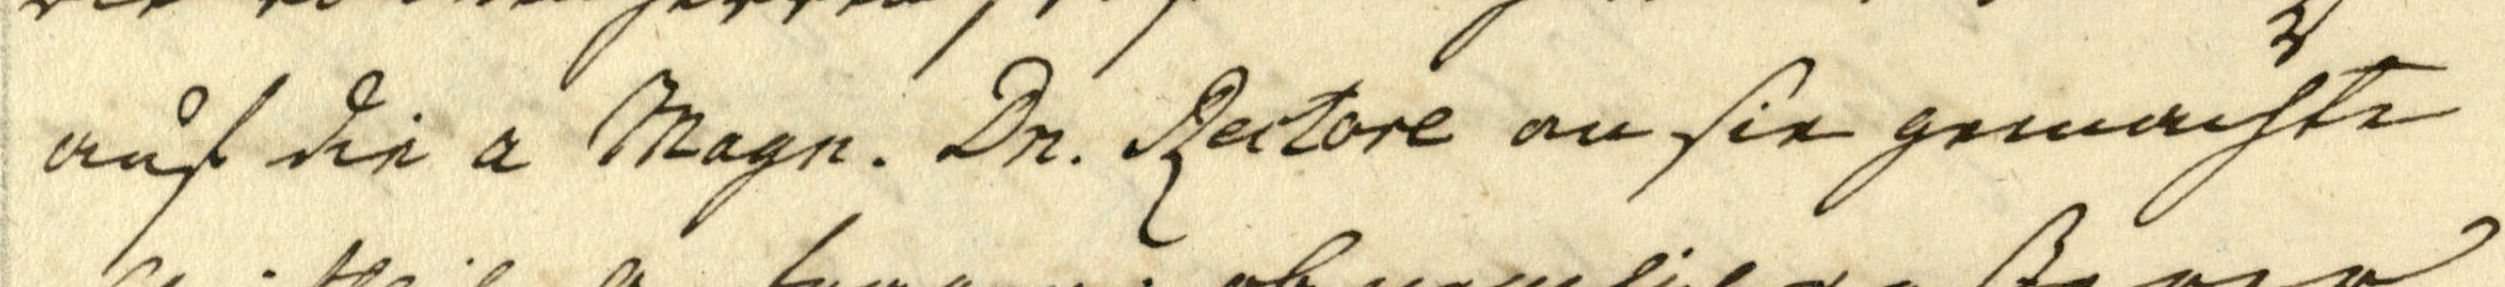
auf die a Magn. Dn. Rectore an sie gemachte
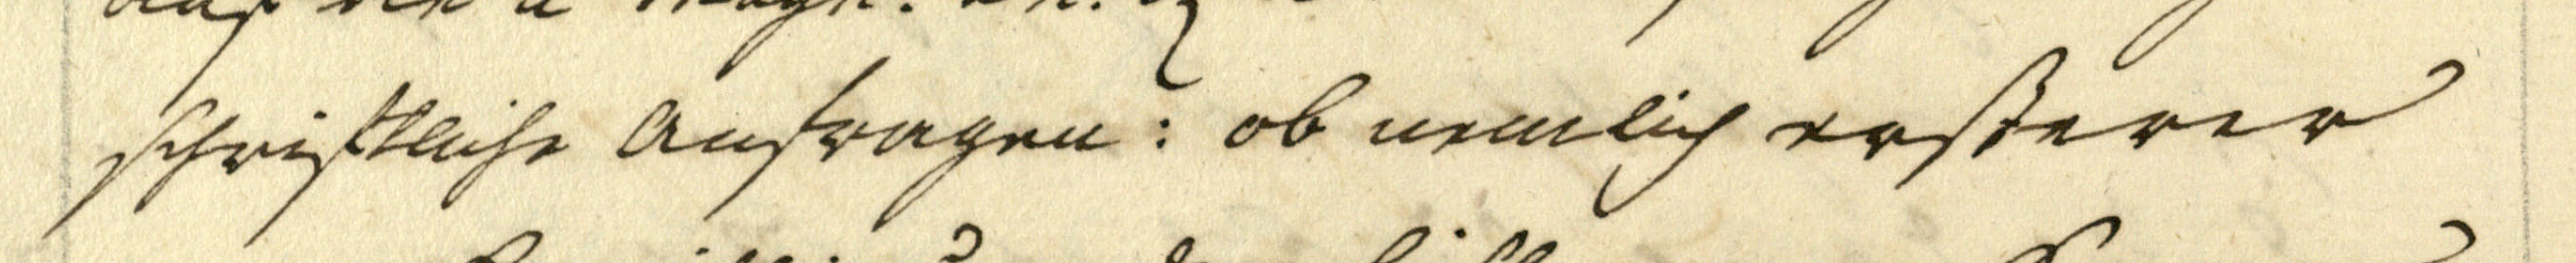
schriftliche Anfragen: ob nemlich ersterer
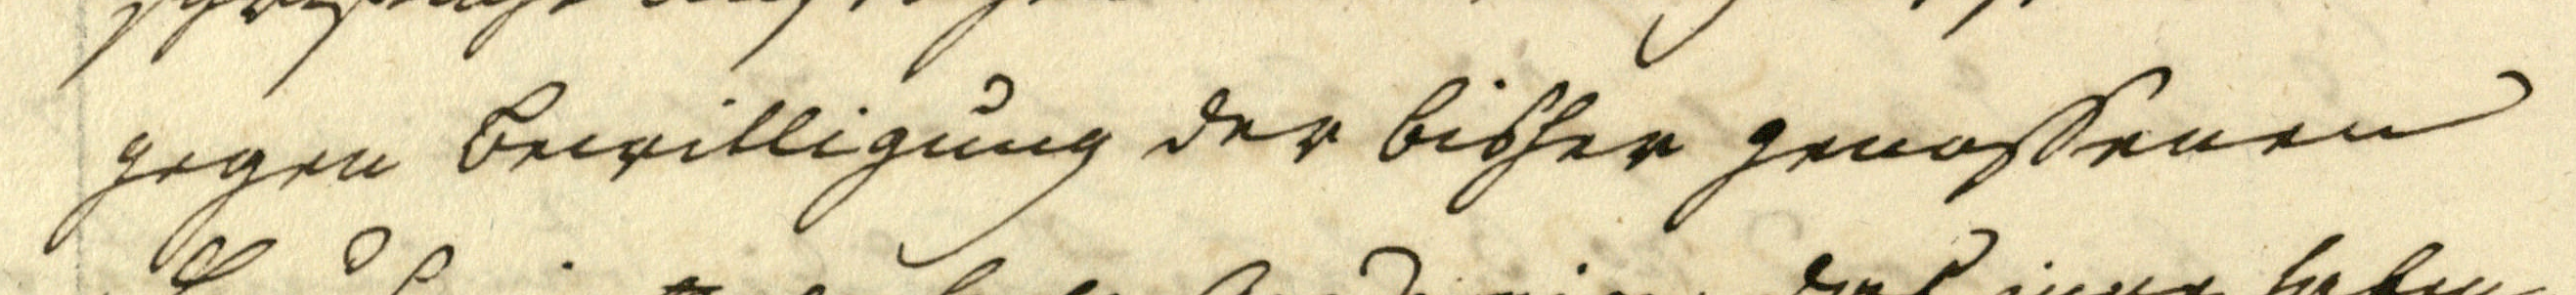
gegen Bewilligung der bisher genossenen
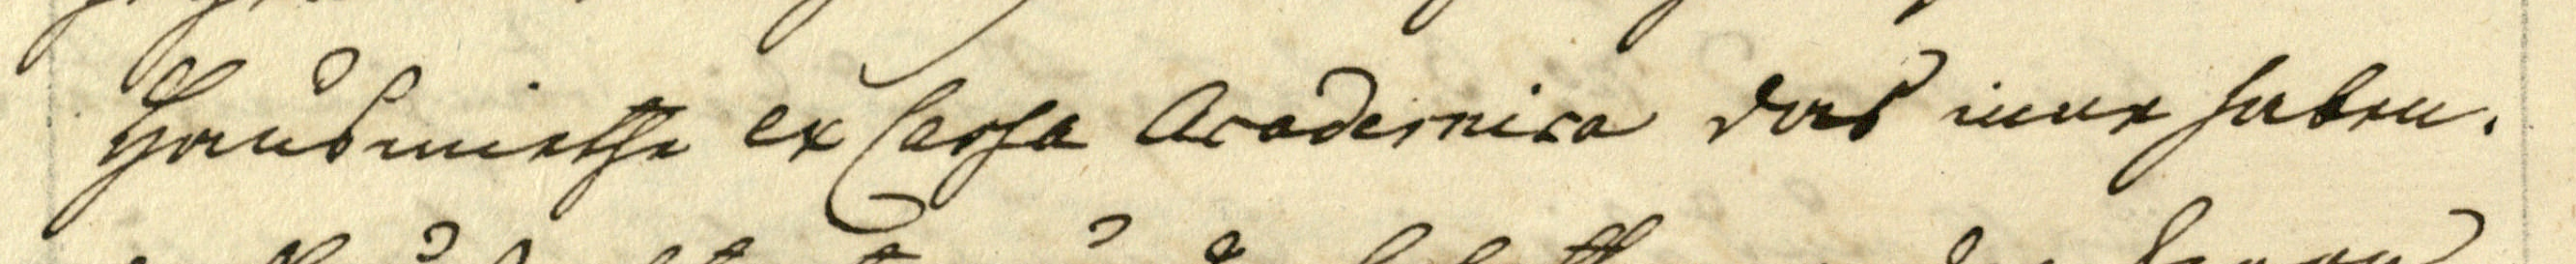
Hausmiethe ex Cassa Academica das inne haben¬
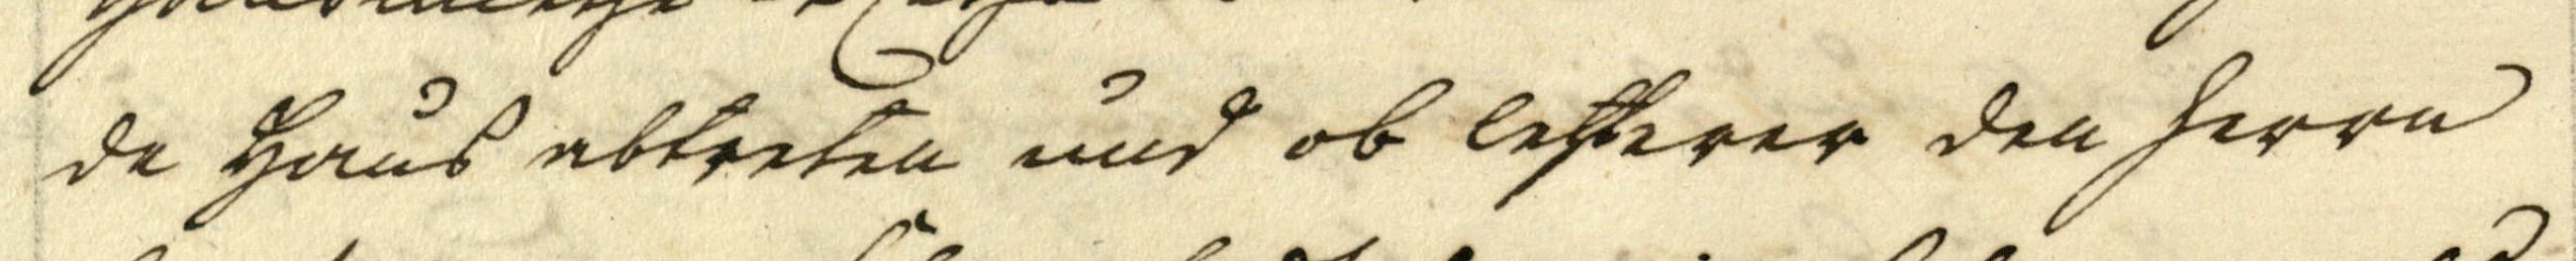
de Haus abtreten und ob letzterer den Herrn
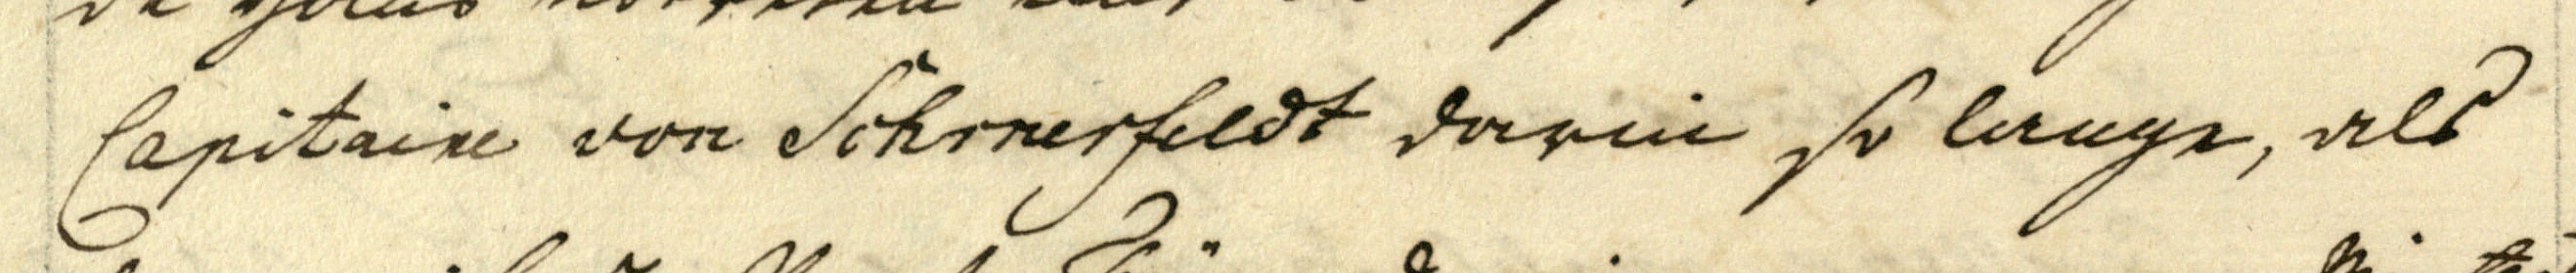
Capitaine von Schmerfeldt darin so lange, als
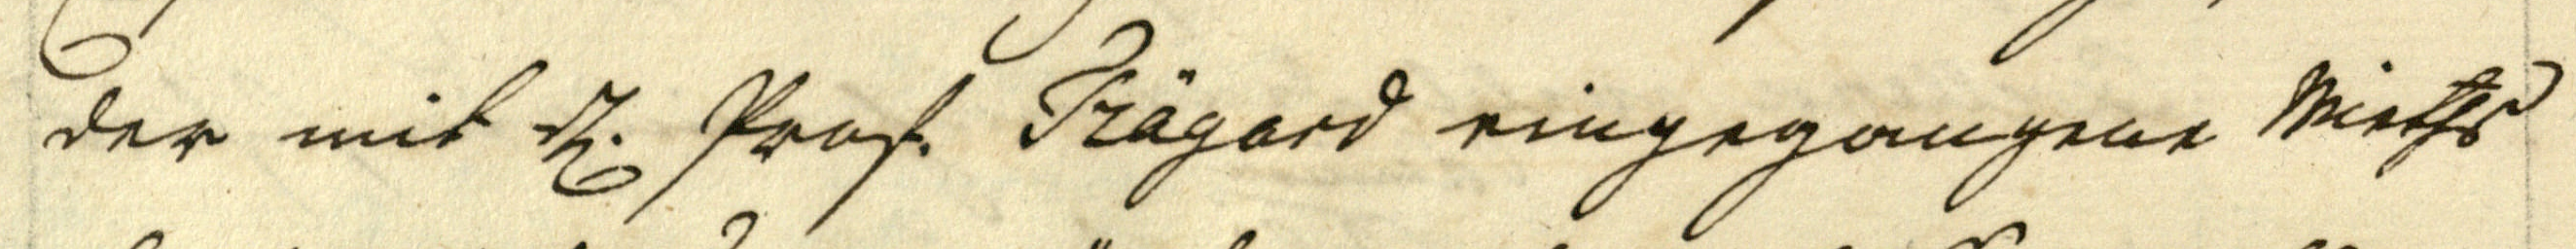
der mit dh. Prof. Trägård eingegangene Mieths
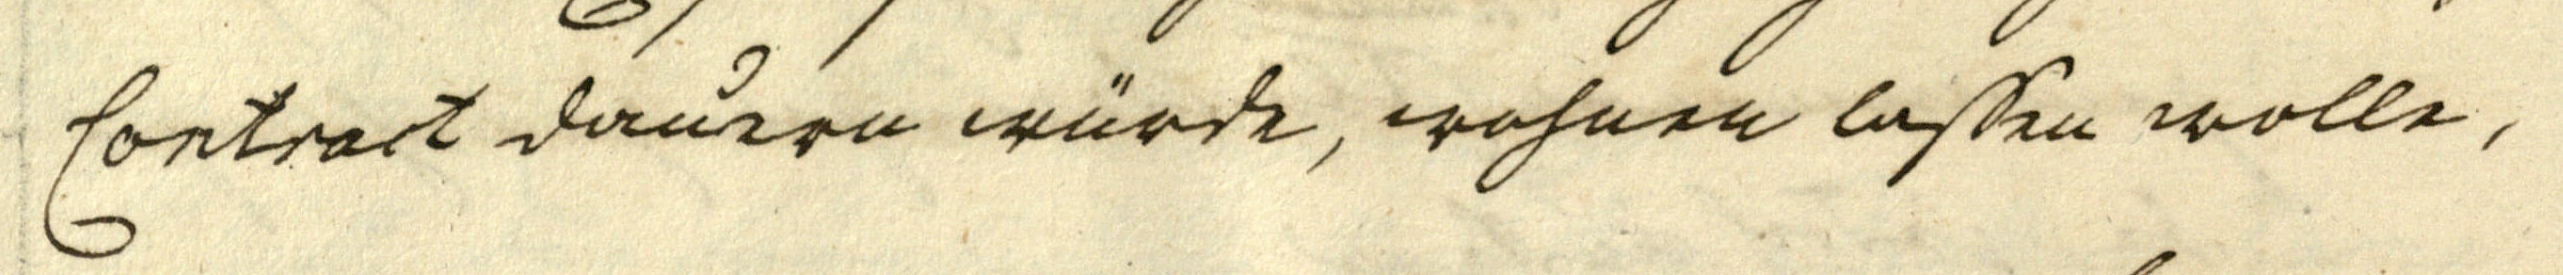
Contract dauern würde, wohnen lassen wolle,
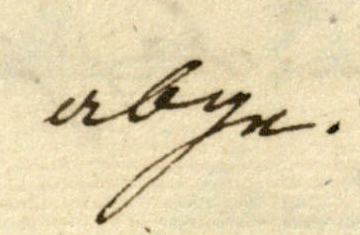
abge-
